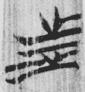者
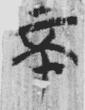不
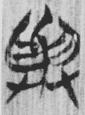與
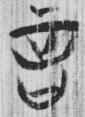言
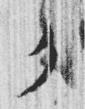人
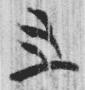之
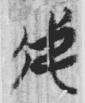俤（弟）
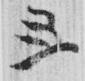之
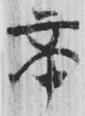不
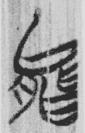能
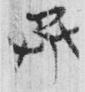丞（承）
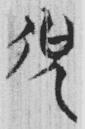○（兄）
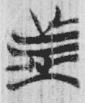者
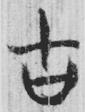古（故）
